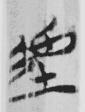𫊟
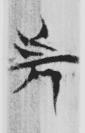先
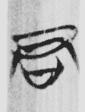君
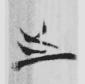之
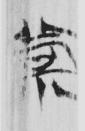常
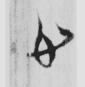心
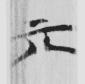亓
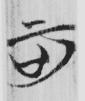可
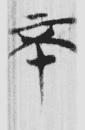不
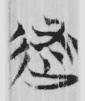述
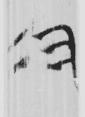今
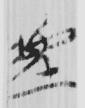𫊟
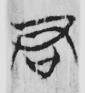君
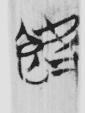即
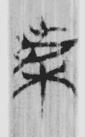枼
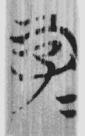乳=
